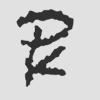{口木}
